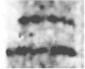二
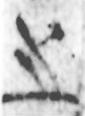之
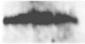一
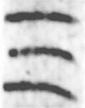三
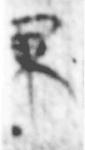果（戈）
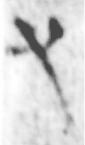又（有）
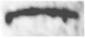一
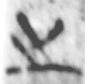之
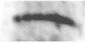一
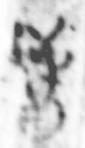晉
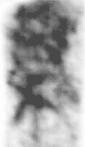杸
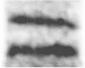二
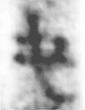屯
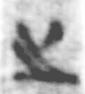之
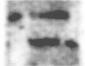二
